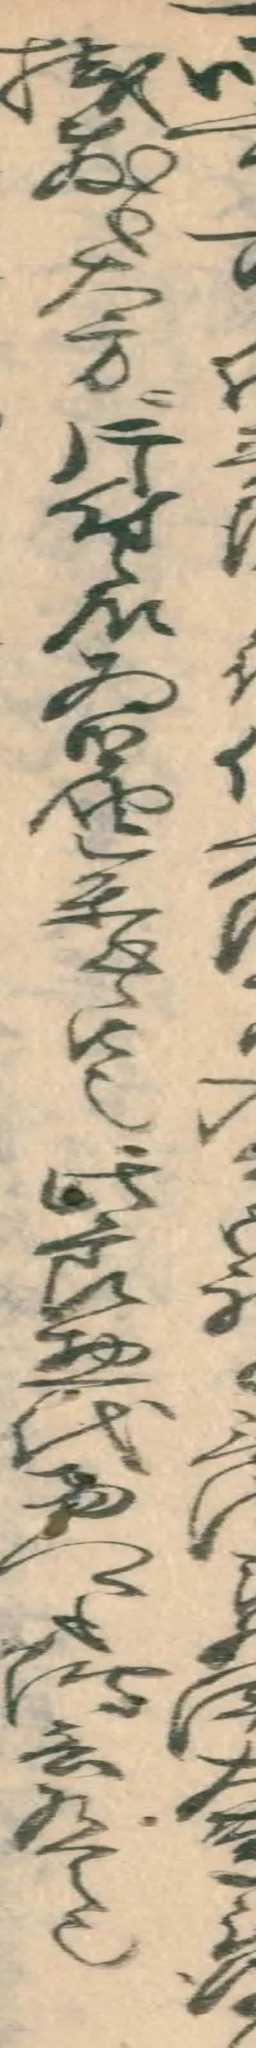桟敷も大方ニ片付候故為御届参上候由也此節惣代両人へも伝言有之也
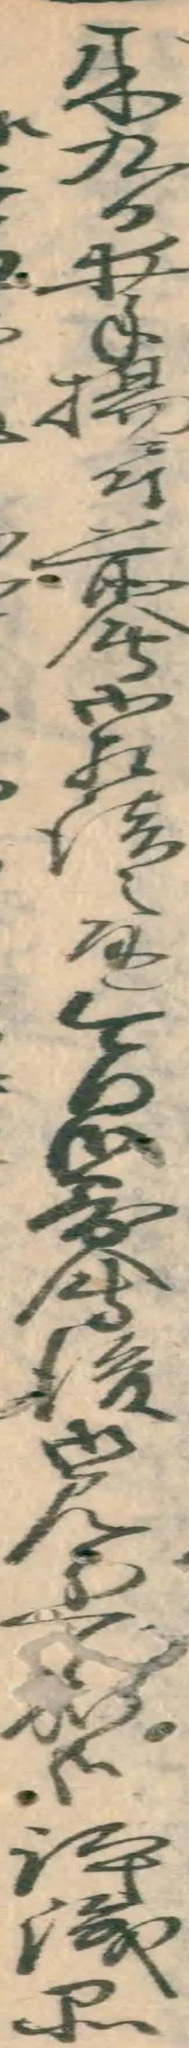一来九日井手揚ニ付前会御相談之通今日御寄会後御見分可被成哉評議品
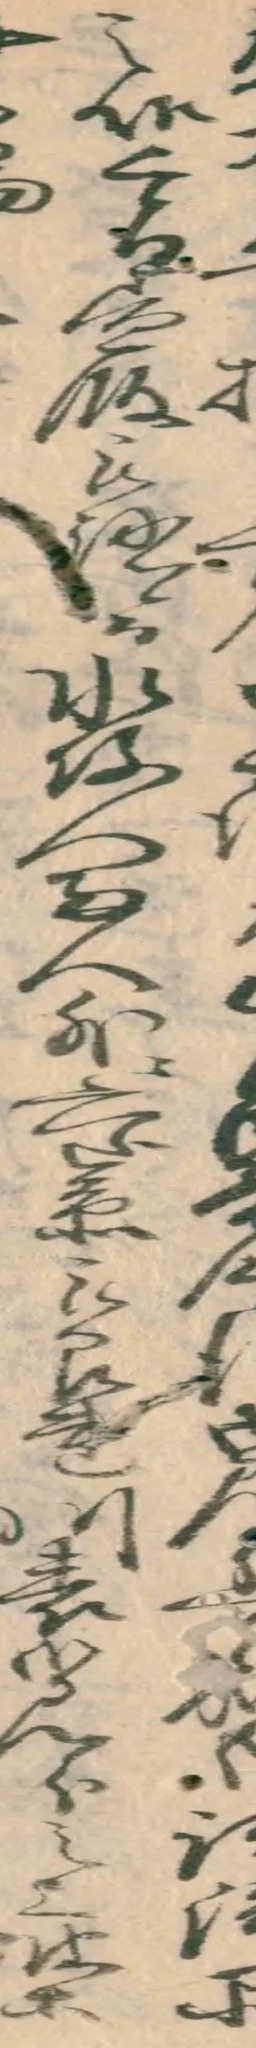之処今日昼飯被認候而水役人両人外ニ六郎兵衛被召連川表御見分之上彼等
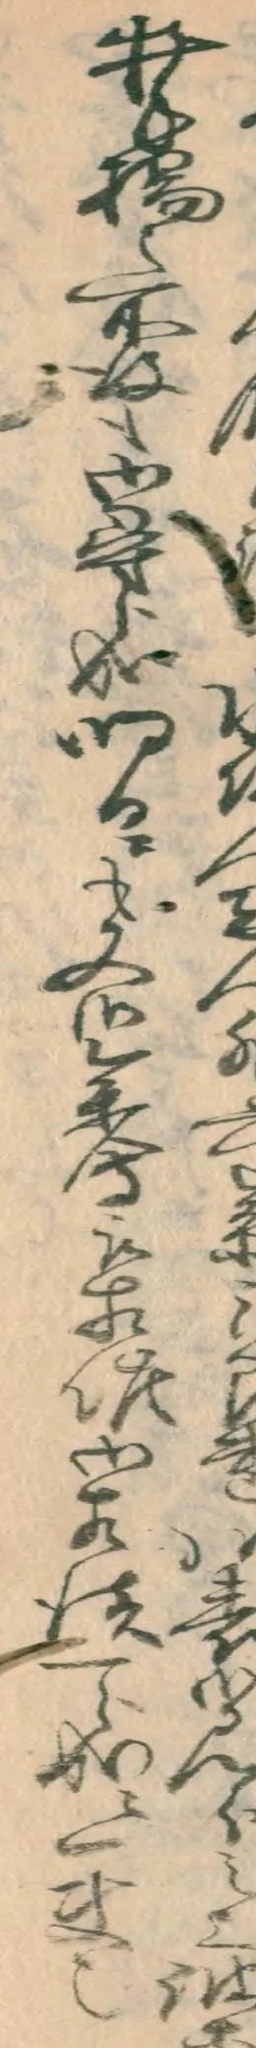井手揚之所存も御尋被成明日ニも又御参会被相催御相談可被成ニ一決也
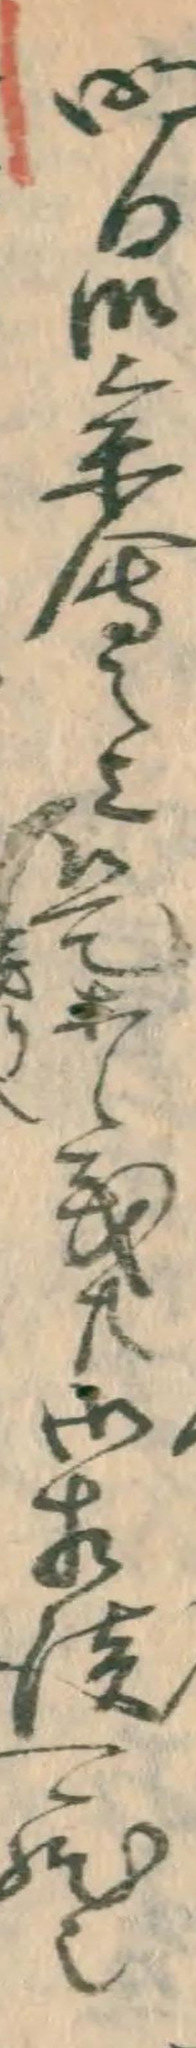明日御参会之上是等之義共御相談可然也
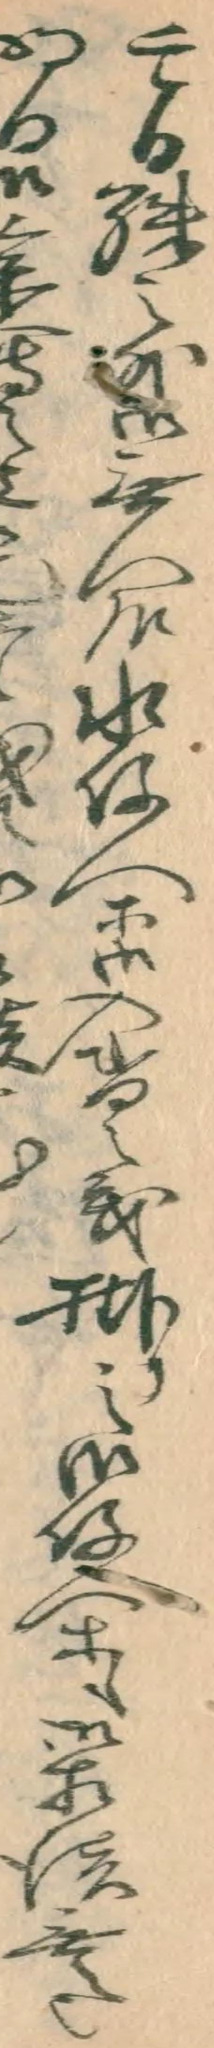今日殊之外御無人故水役人等御入替之義掛り之御役人等も御相談無之也
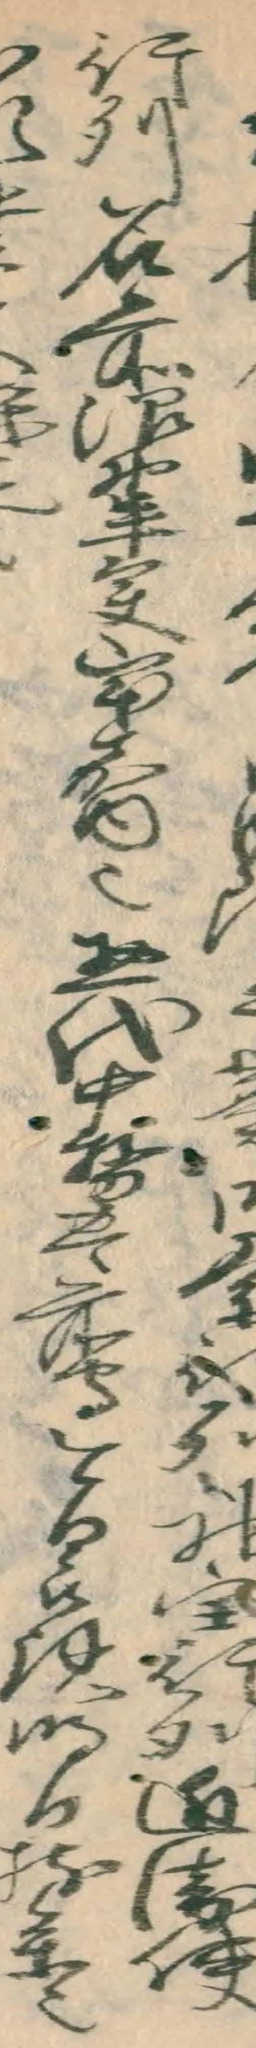行列名前沼野半大夫山本嘉内也惣代中務豊前守今日被認明日持参也
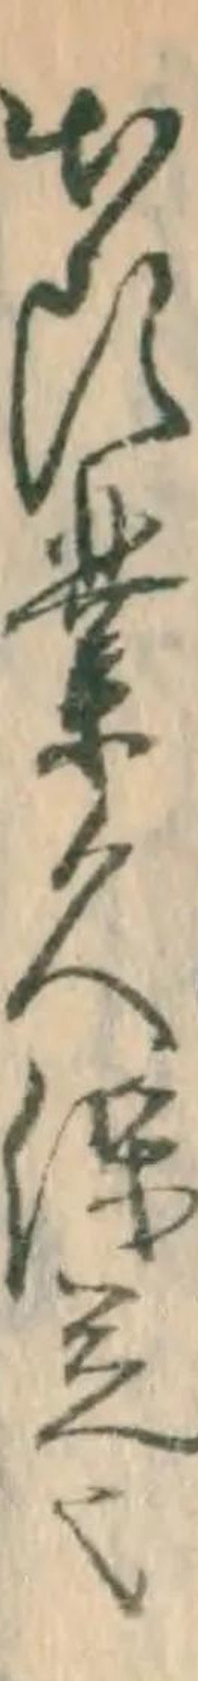出頭業久保覚也
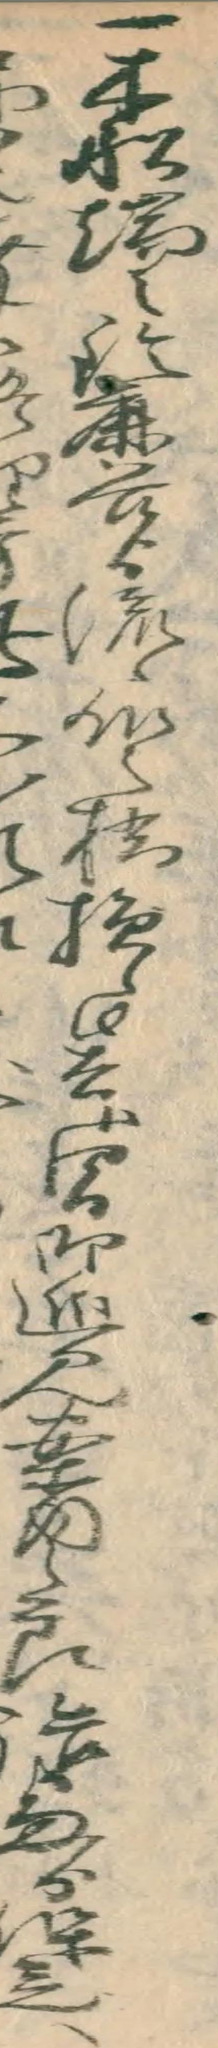一木船端之鈴鹿谷ゟ流候処之橋損候由去ル四日御巡見案内之節詰番ゟ保覚へ
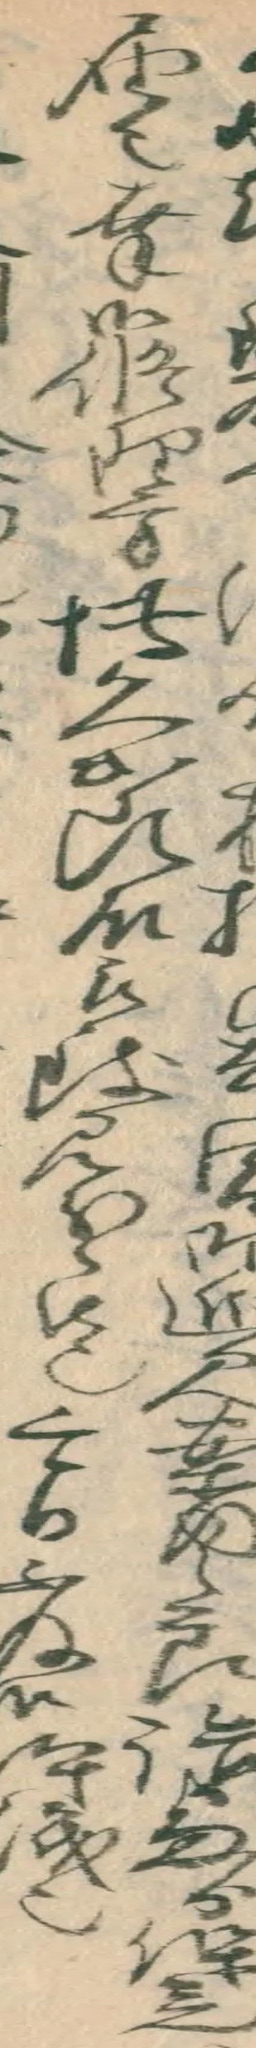届也幸御修理方博久出頭故被致見分候由也今日不及御評議也
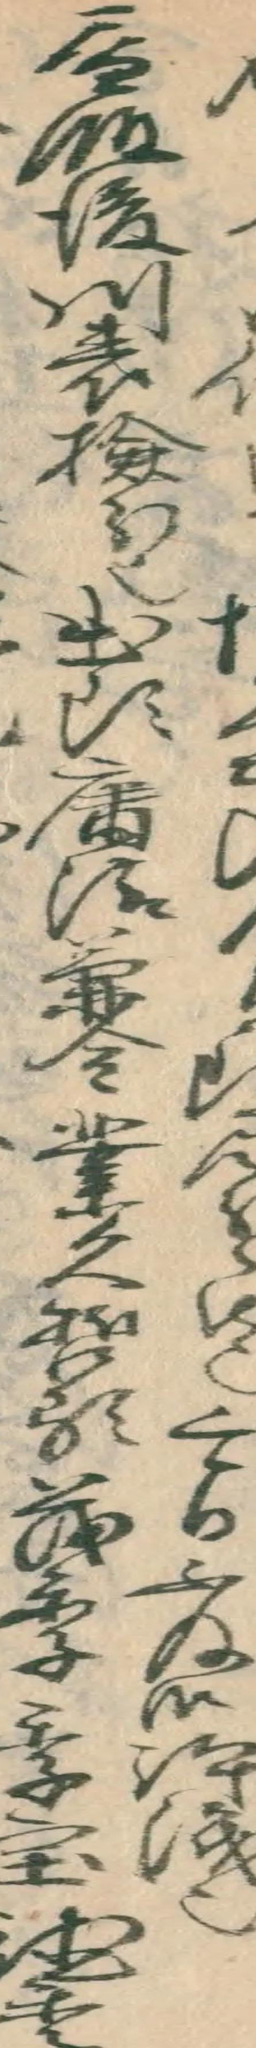一昼飯後川表検分也出頭庸清兼令業久哲顕茂季季宝徳季
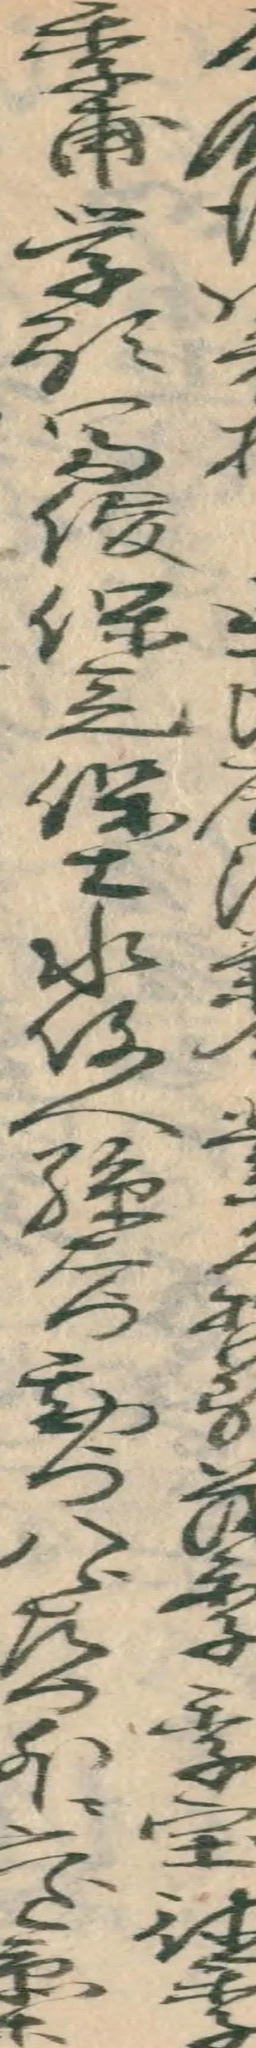季甫学顕富俊保覚保土水役人孫右衛門勘右衛八郎左衛門外ニ六郎兵衛等
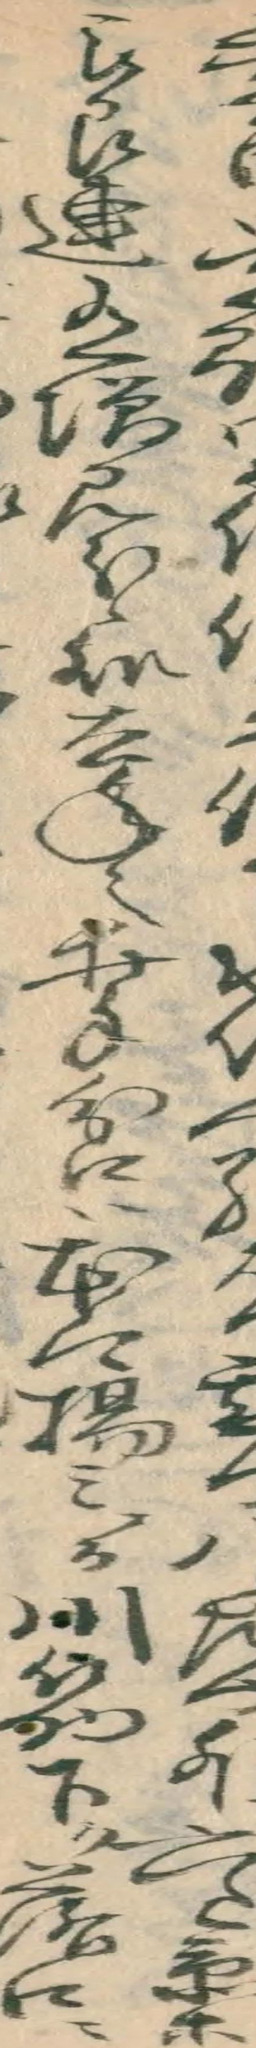被召連有増見分候処去年之井手分口ハ本郷揚ミニ而川筋下ケ落口ニ
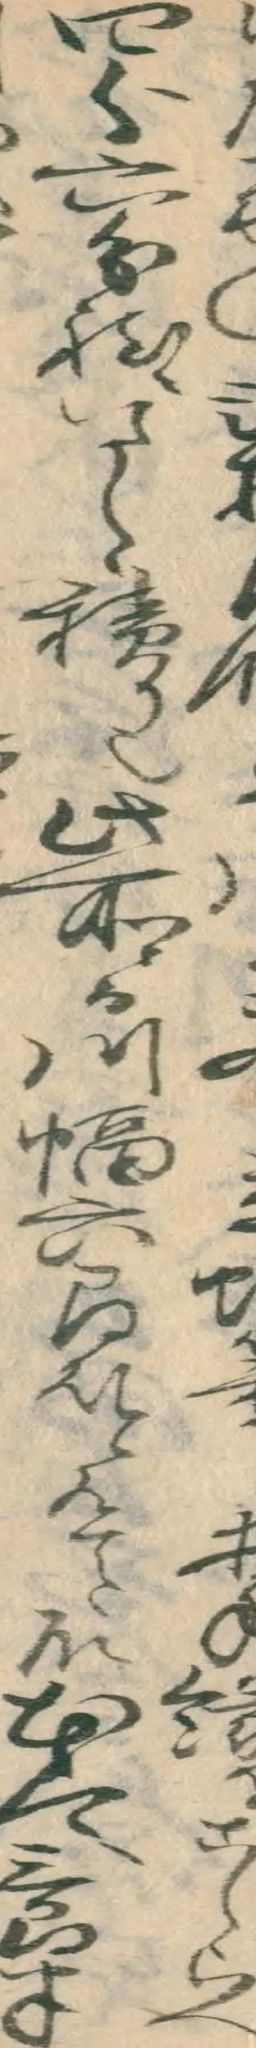四分六分程ニいたし候積り也此所ニ而川幅六間ほと有之候故本郷へ三間半
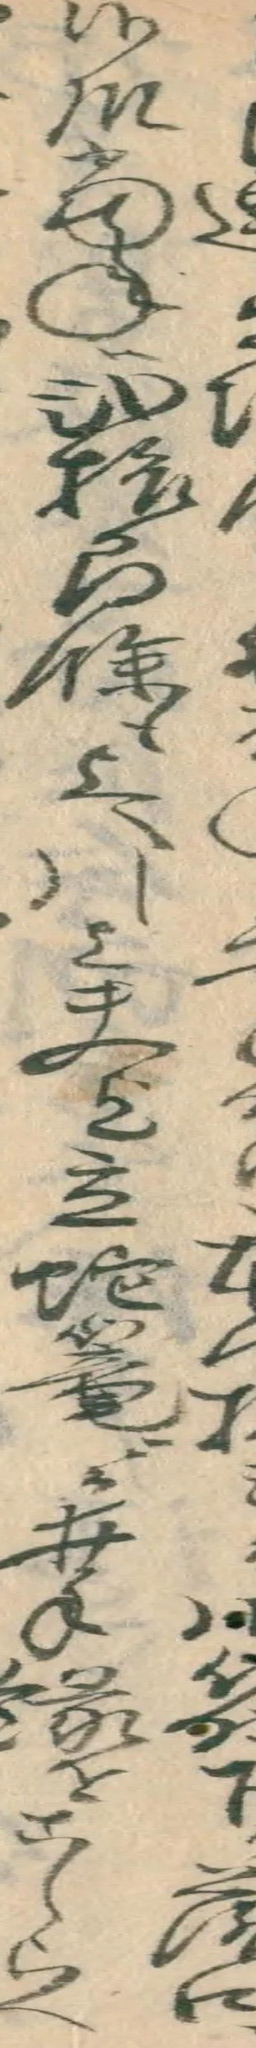候故当年ハ弐拾間余も上へ引上夫迄立蛇篭ニ而井手縁をこしらへ
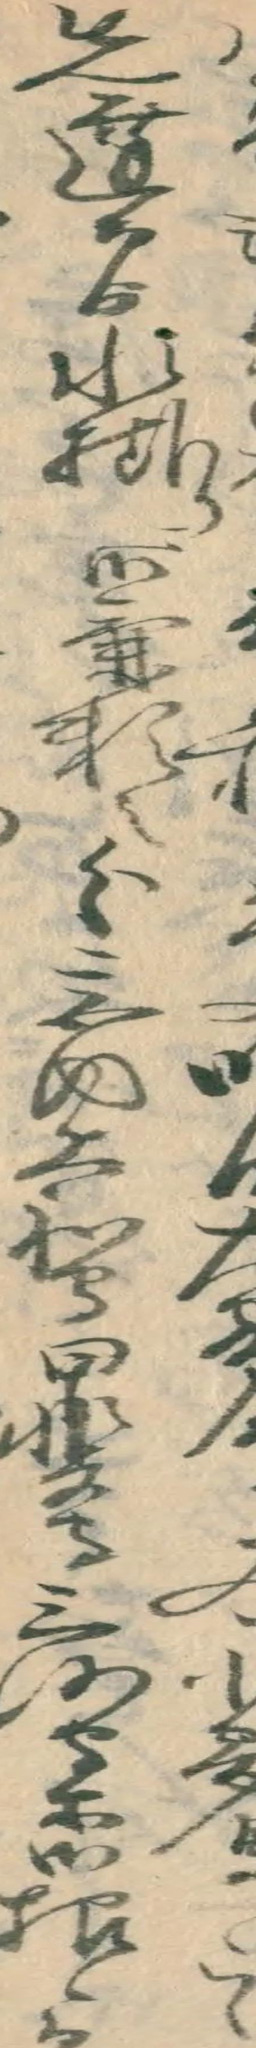先達而ゟ水掛り御兼頼之分宮内大和守甲斐守三河守等御招候而
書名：賀茂社記録. 第58冊
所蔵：国立国会図書館 National Diet Library, JAPAN
